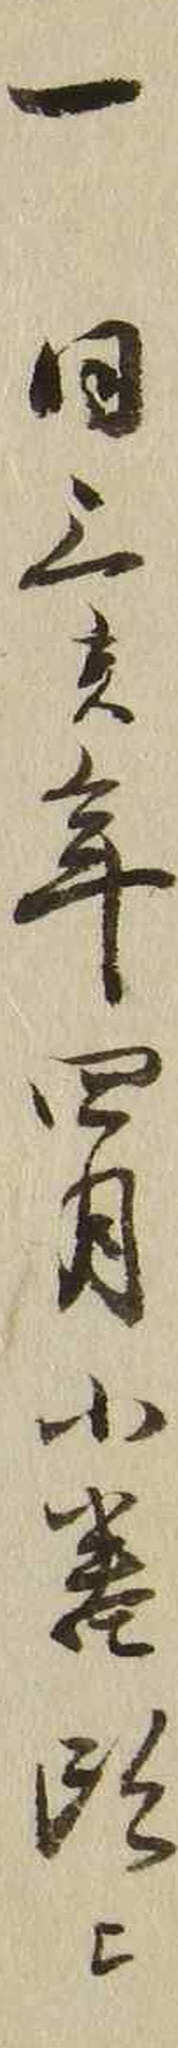一同三亥年四月小番頭被
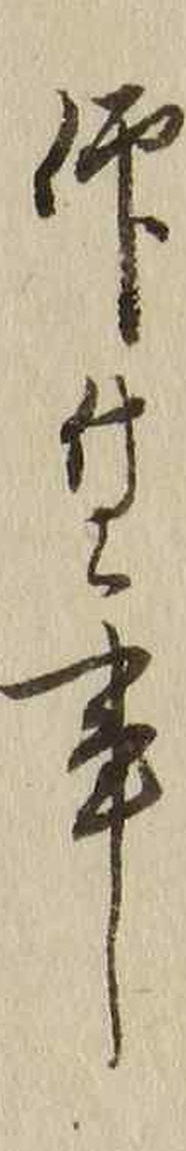仰付候事
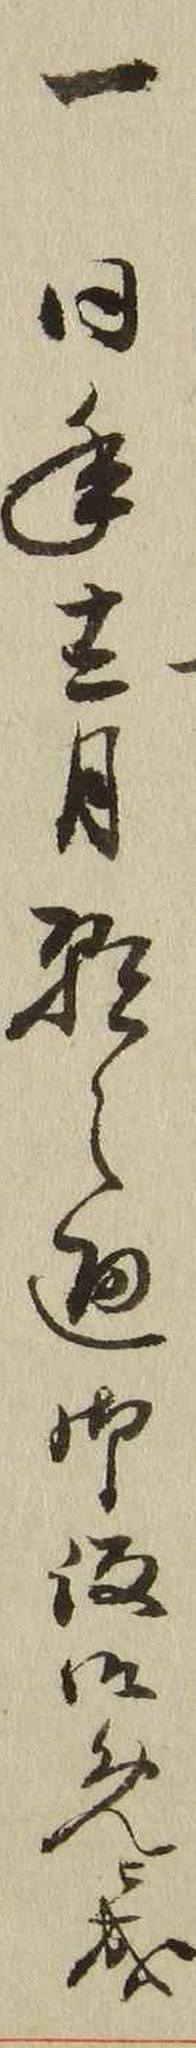一同年十二月願之通御役御免被成
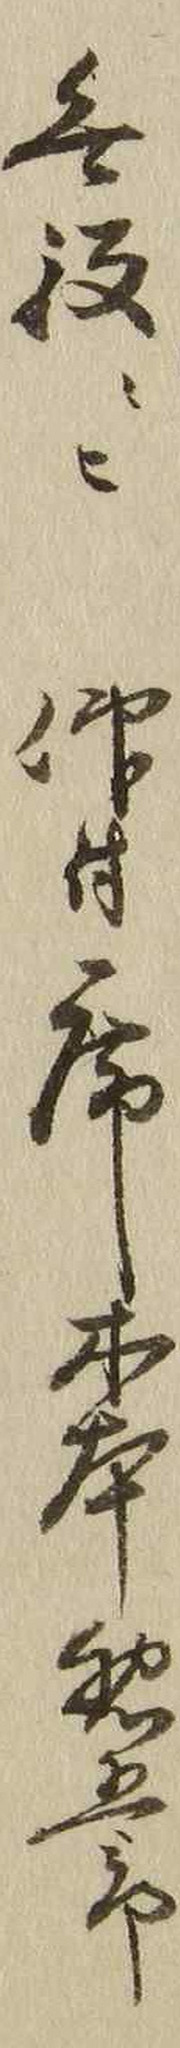無役ニ被仰付席木本惣五郎
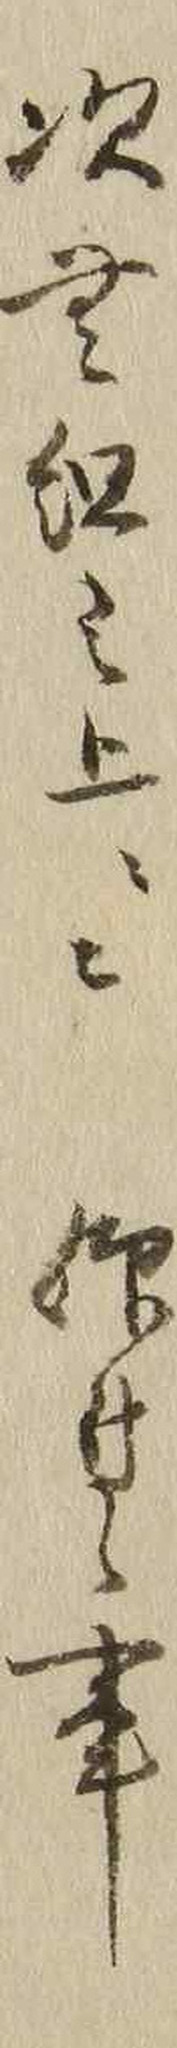次無組之上ニ被仰付候事
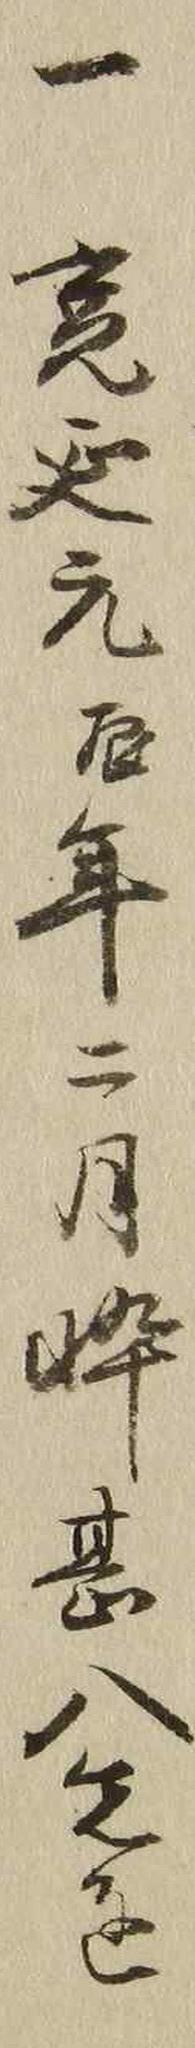一寛延元辰年二月忰甚八先達
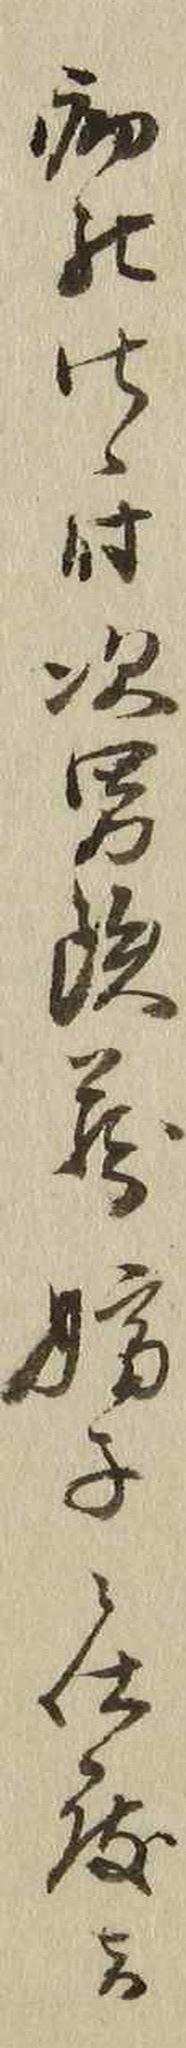病死仕候付次男鉄蔵嫡子ニ仕度旨
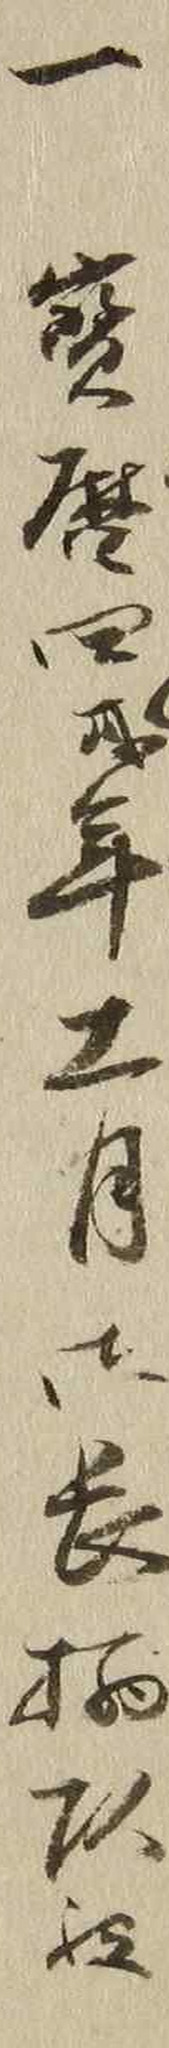一宝暦四戌年十一月御長柄頭被
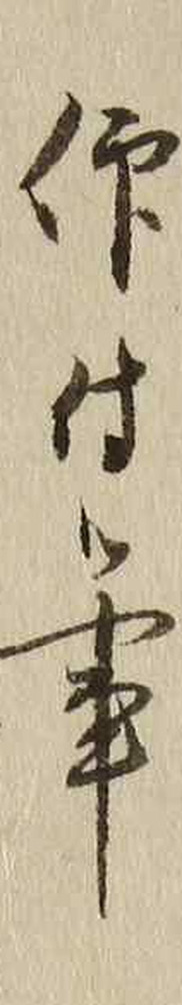仰付候事
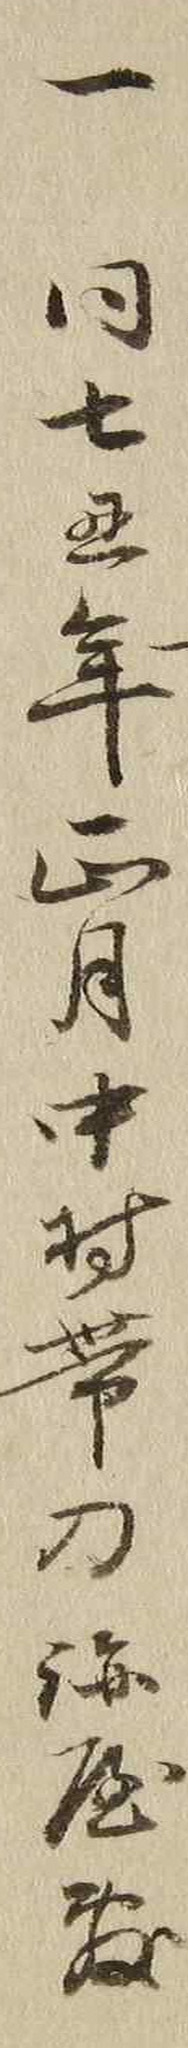一同七丑年正月中村帯刀跡屋敷
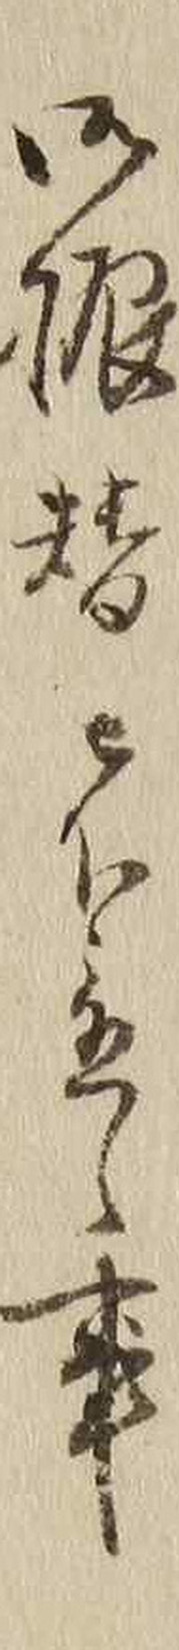御振替被下置候事
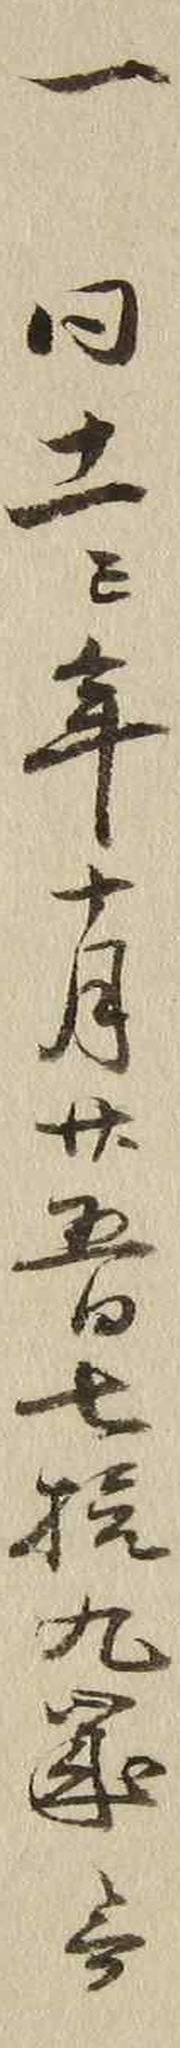一同十一巳年十月廿五日七拾九歳ニ而
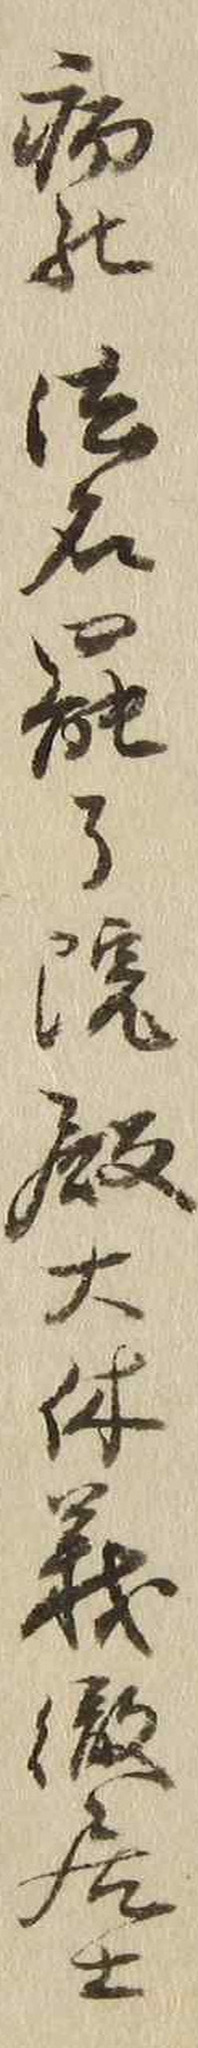病死法名罷了院殿大休義徹居士

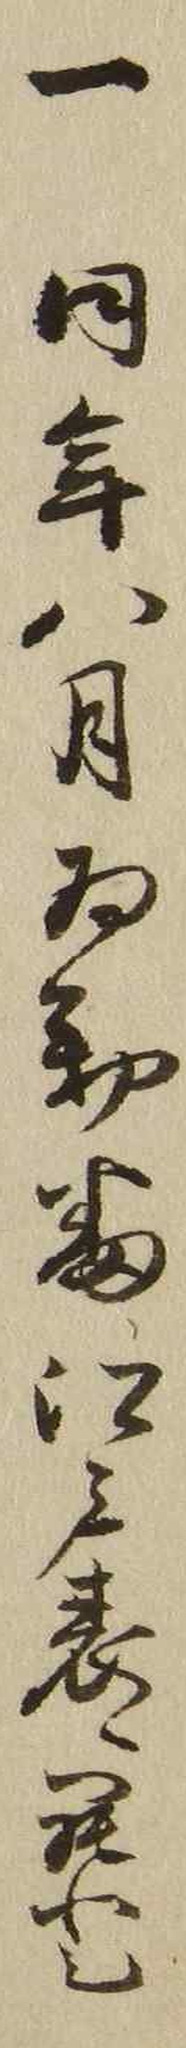一同年八月為勤番江戸表へ罷登
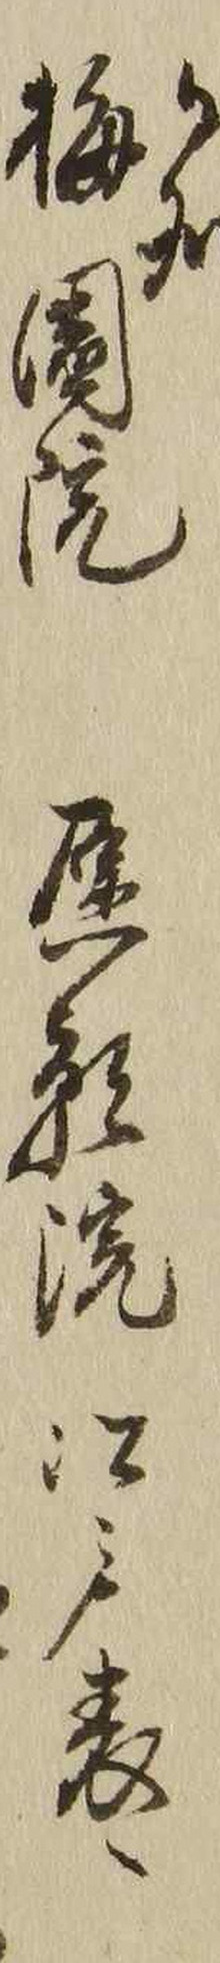梅園院愿影院江戸表へ
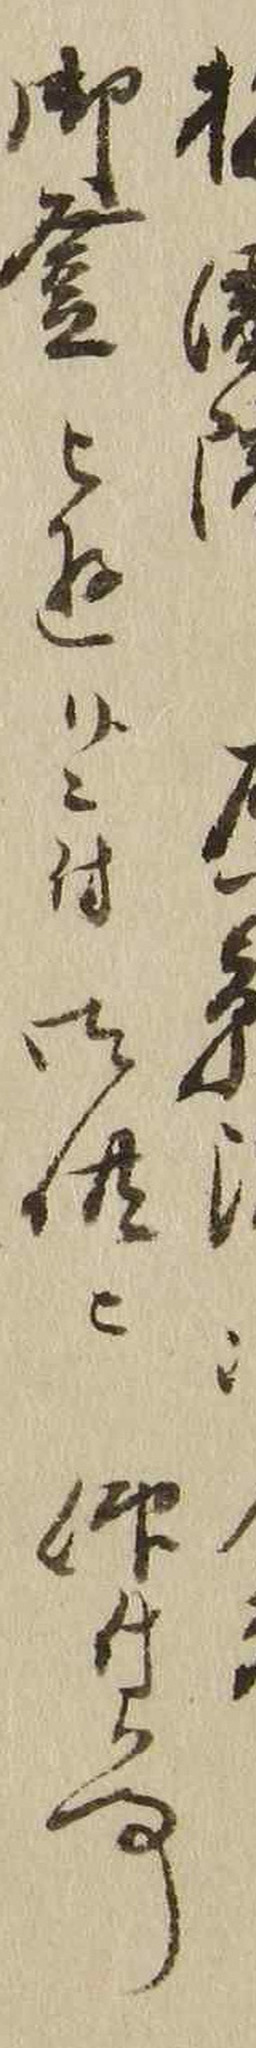御登被遊候ニ付御供被仰付候事
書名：諸士系譜　巻之225　ま之部6
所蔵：会津若松市立会津図書館
